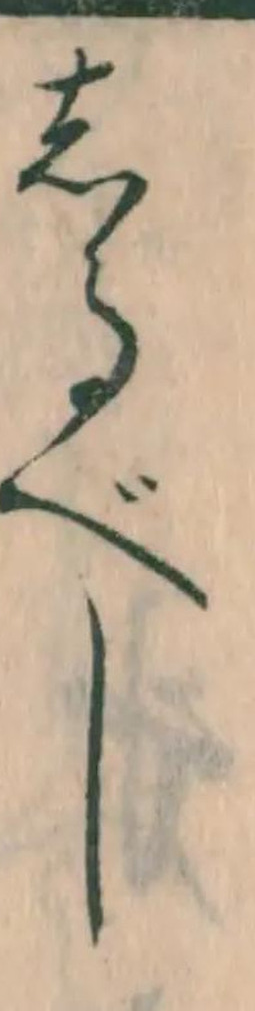しるべし

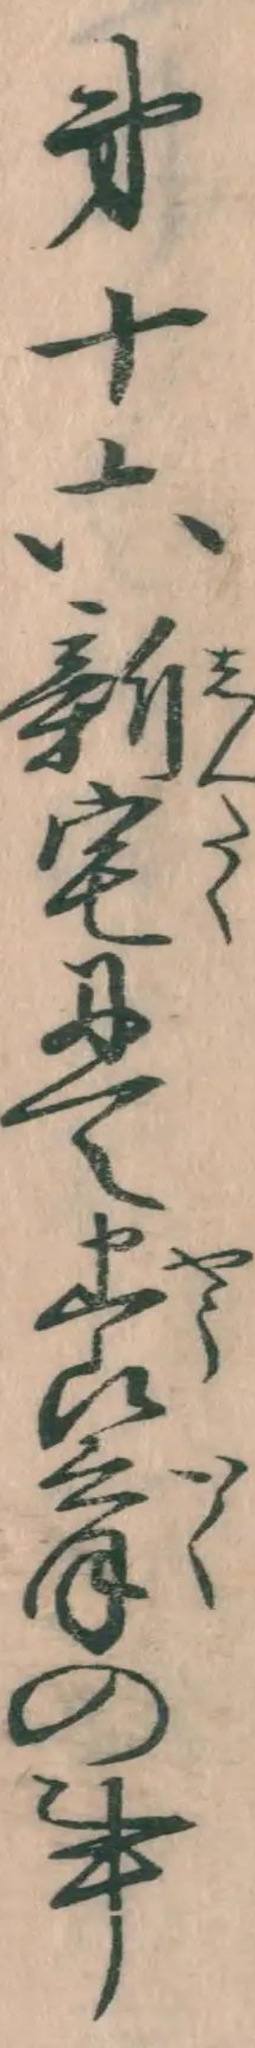第十六新宅にて養育の事
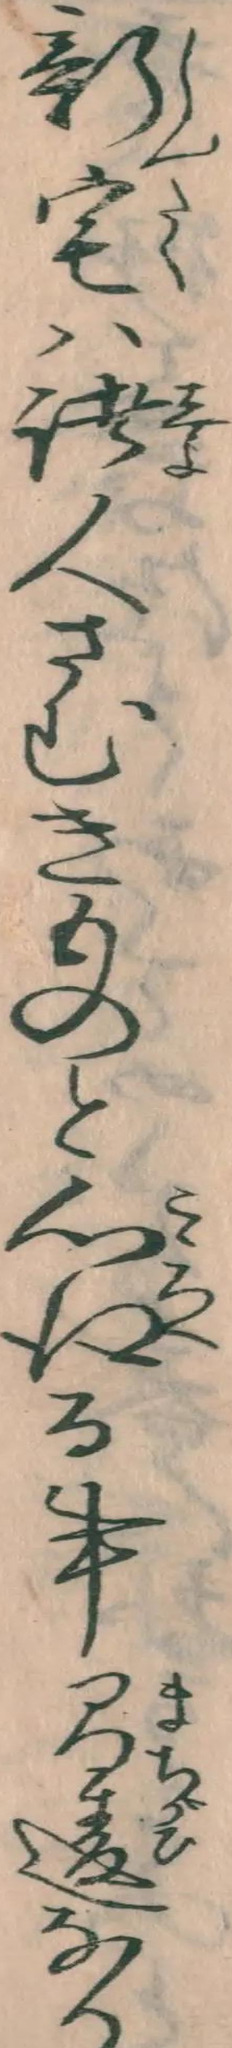新宅は諸人さむきものと心得る事間違なり
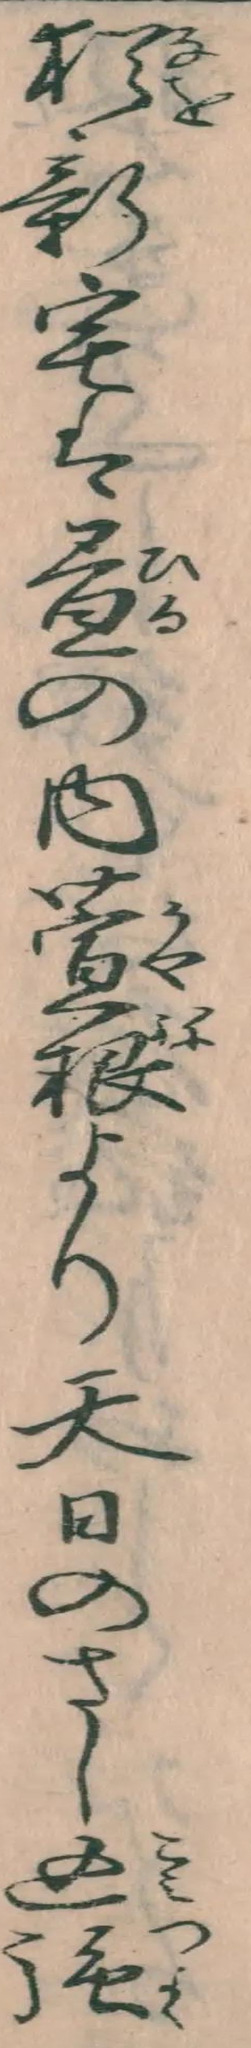猶新宅は昼の内萱根より天日のさし込強
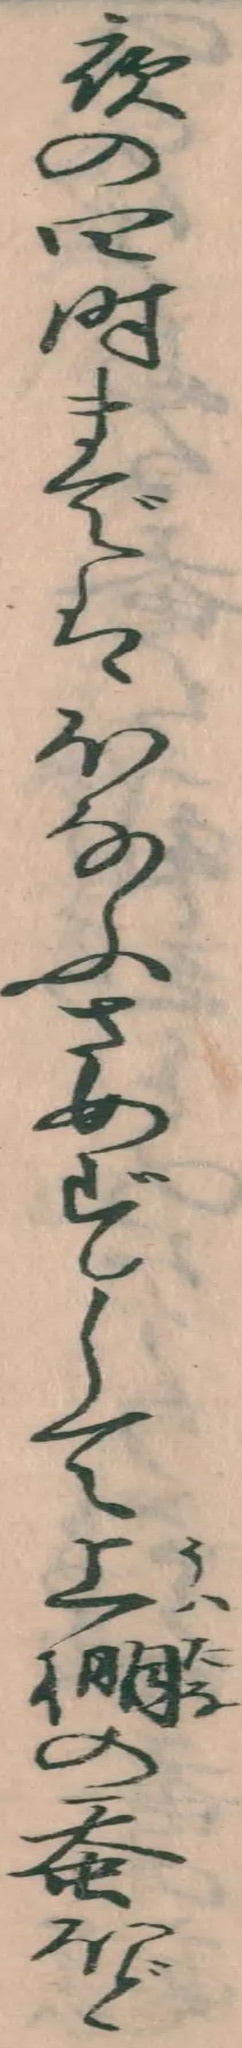夜の四時まではほなふさめずして上棚の蚕ほど
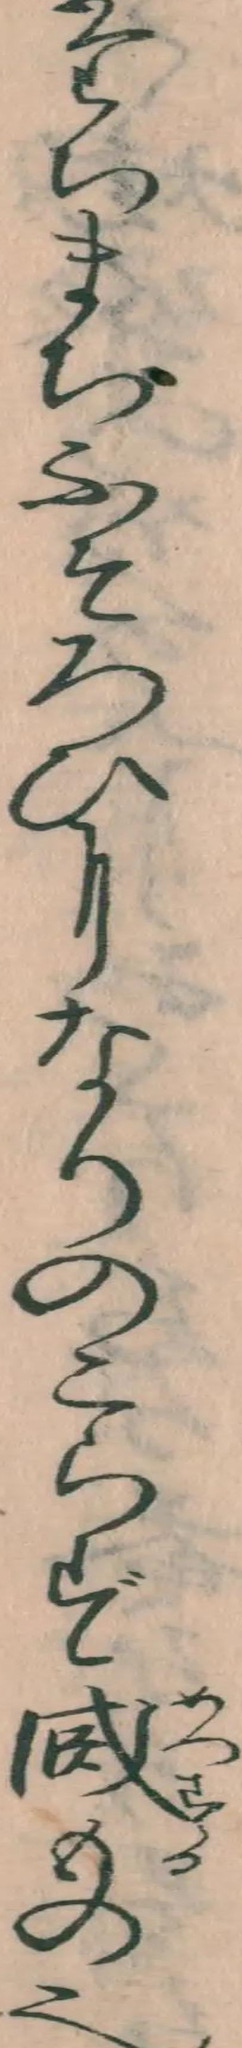たちまちふそろひになりのこらず滅もの也
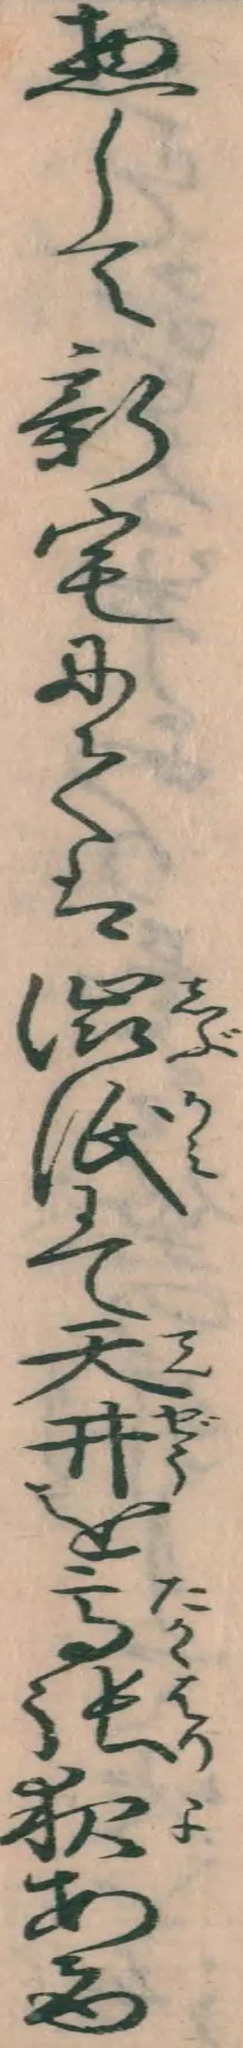惣して新宅にては渋紙にて天井を高張夜あけ
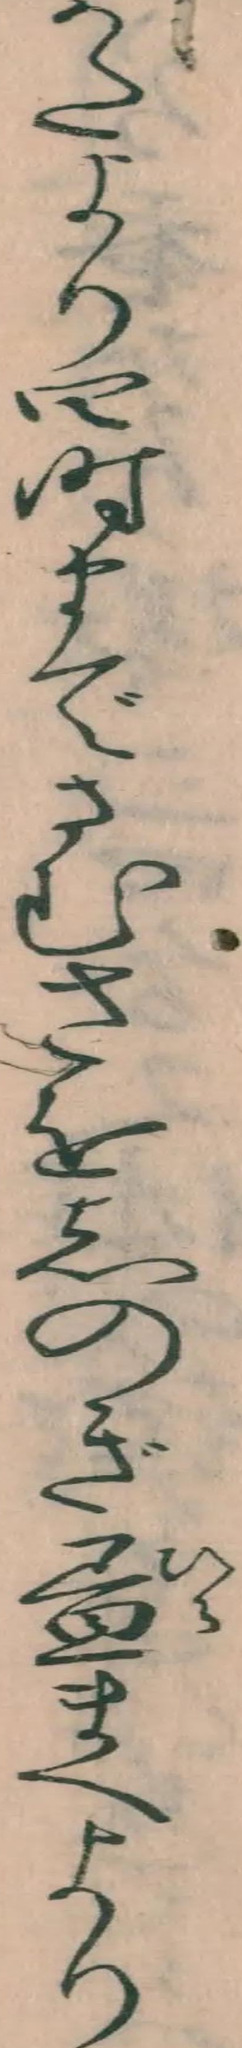かたより四時までさむさをしのぎ昼まへより
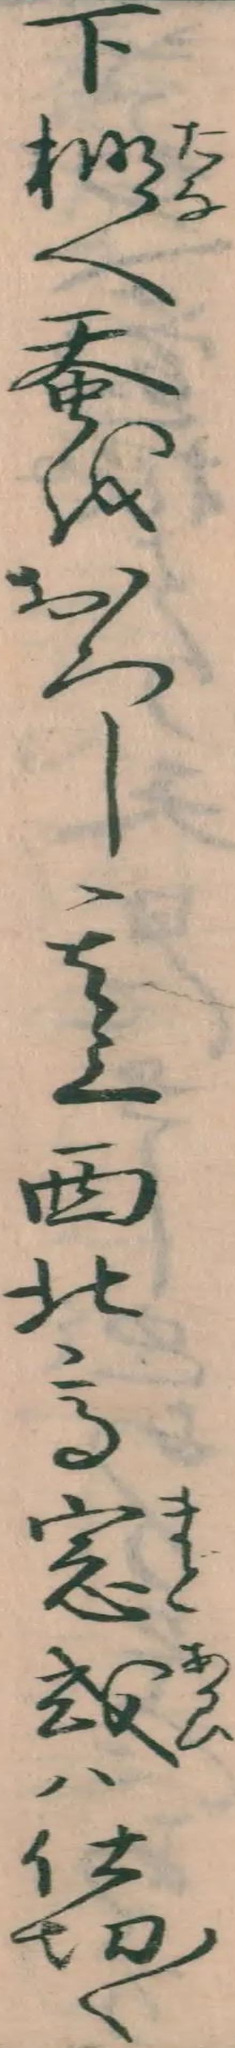下棚へ蚕をおろし其上西北高窓或は仕切〳〵
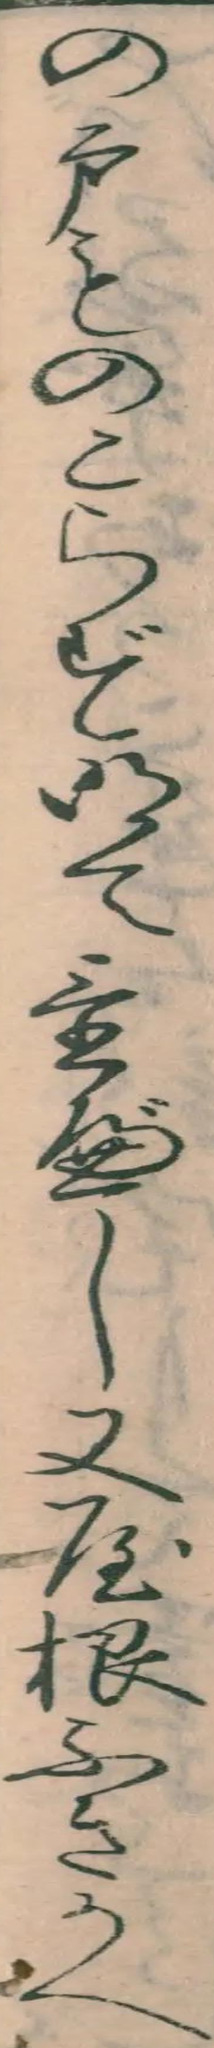の戸ものこらず明て置べし又屋根ふきかへ
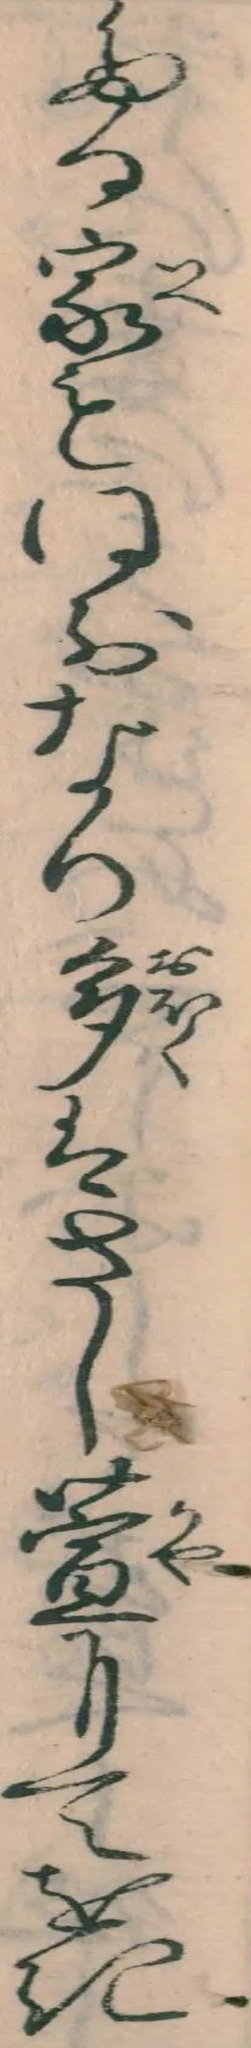たる家も同前なり多はさし萱にてをき
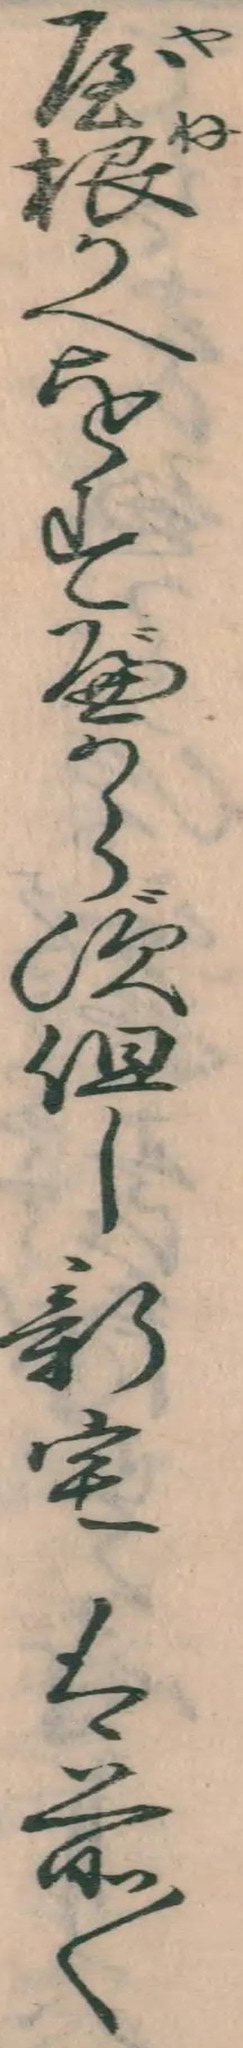屋根かへをすべからず但し新宅は前〳〵
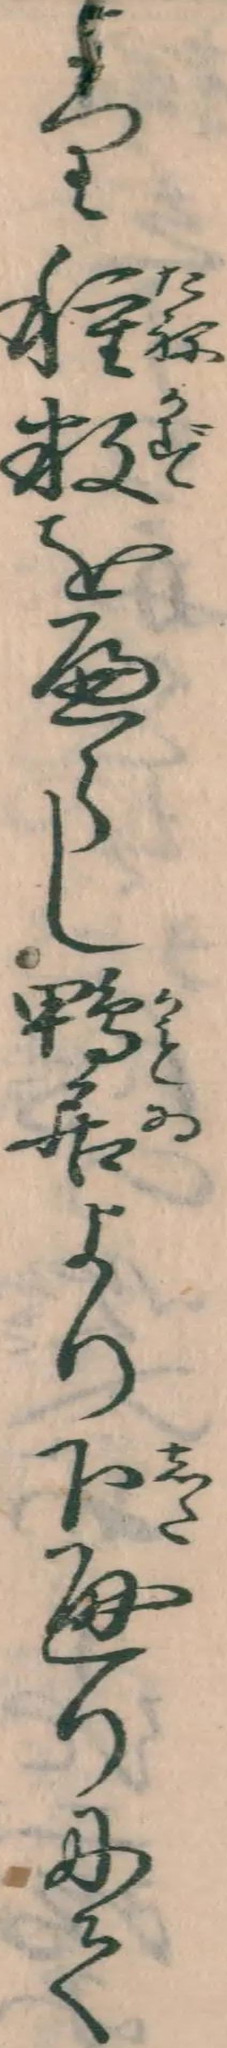より種数をへらし鴨居より下通りにて
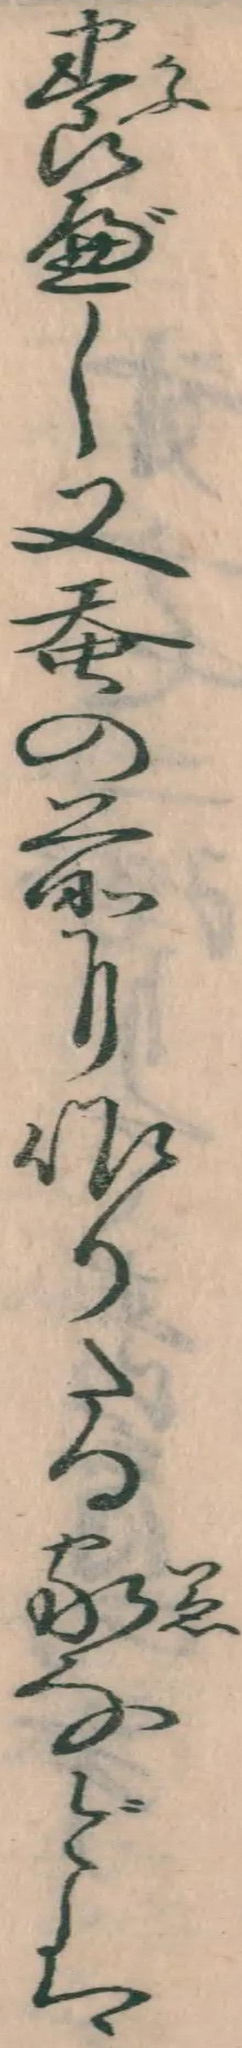養べし又蚕の前に作りたる家などは
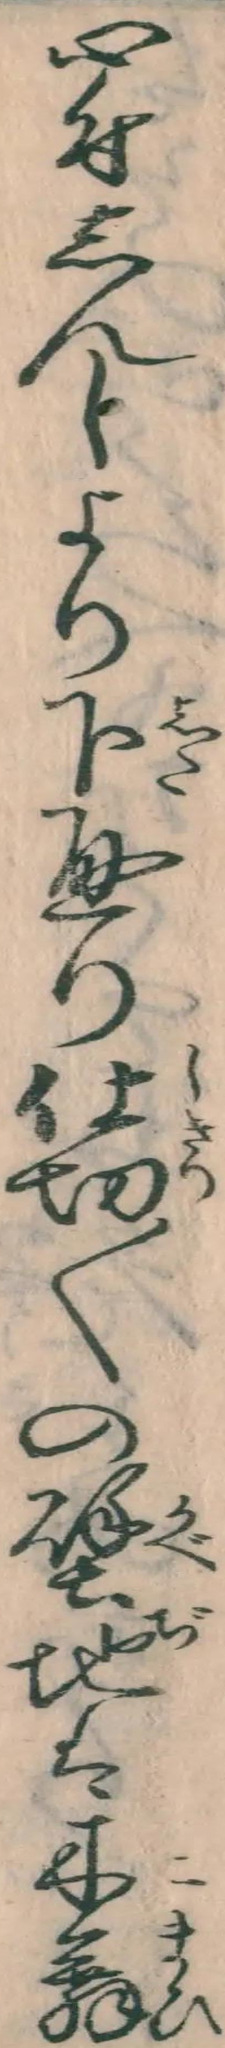心付しんとより下通り仕切〳〵の壁地は木舞
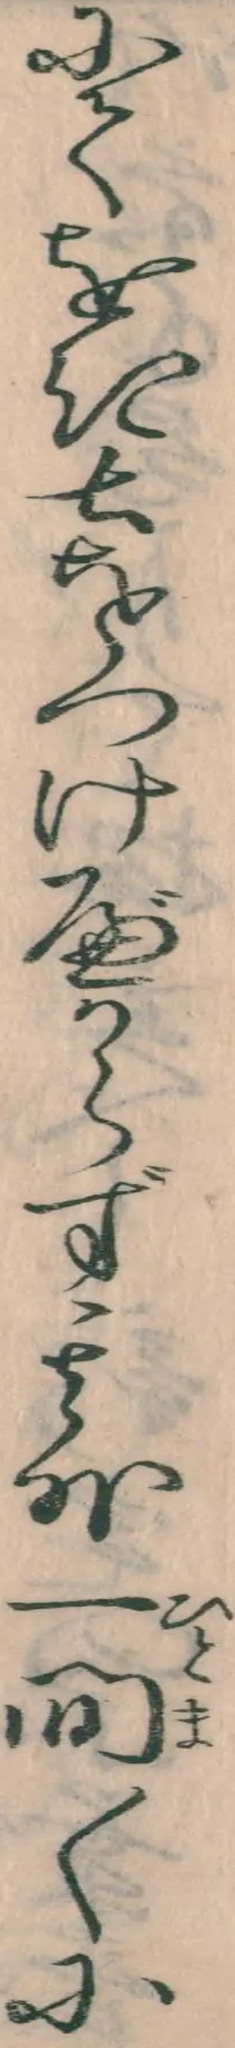にてをき土をつけべからず其外一間〳〵に
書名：新撰養蚕秘書
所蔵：国立国会図書館 National Diet Library, JAPAN
